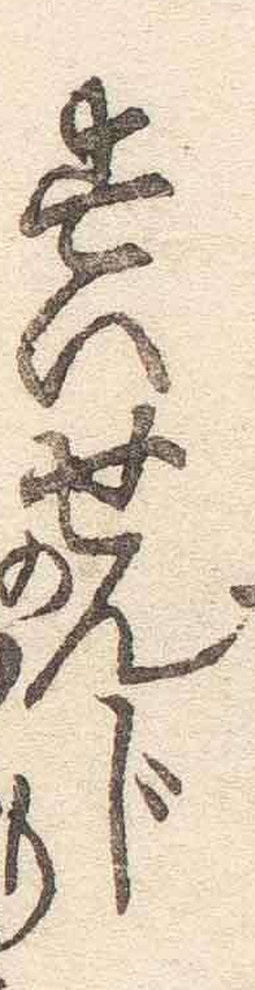すいせんじ
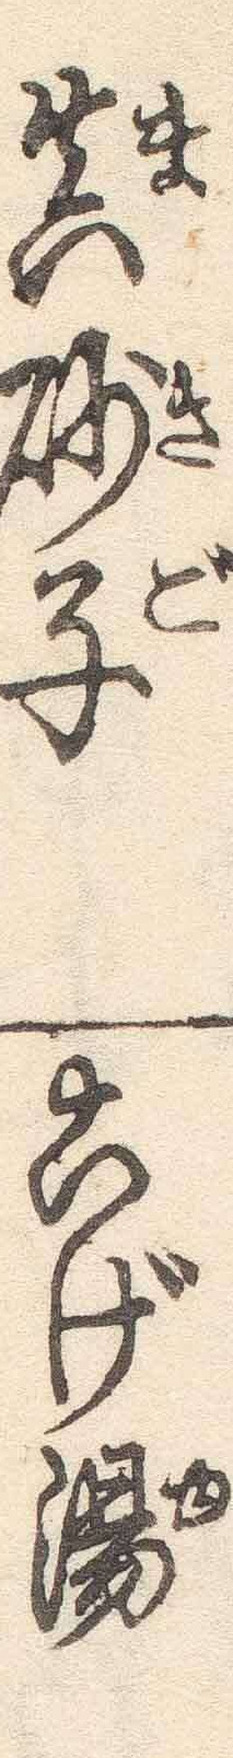真砂子こげ湯
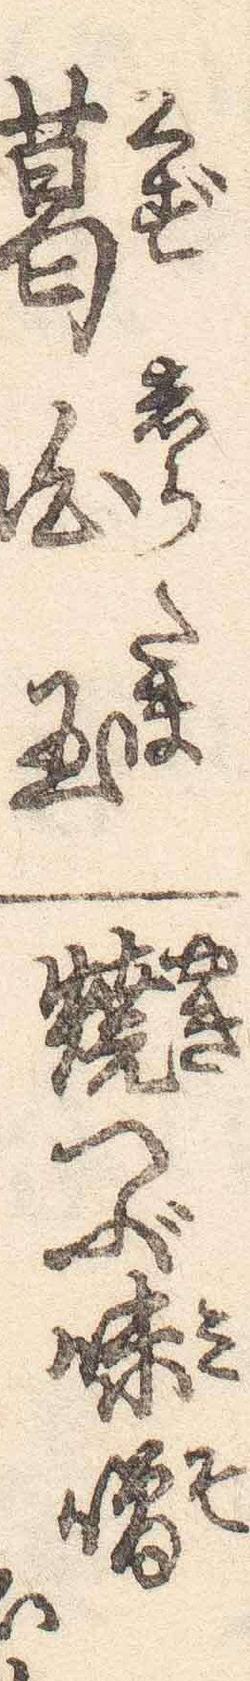葛白玉焼つぶ味噌
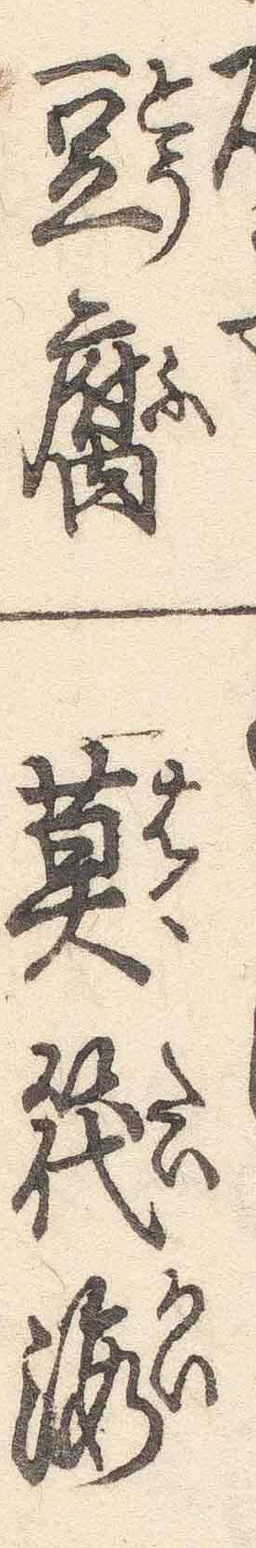豆腐莫筏海
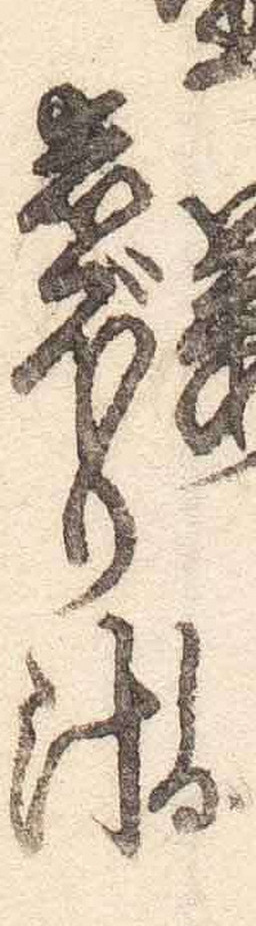しぼり汁
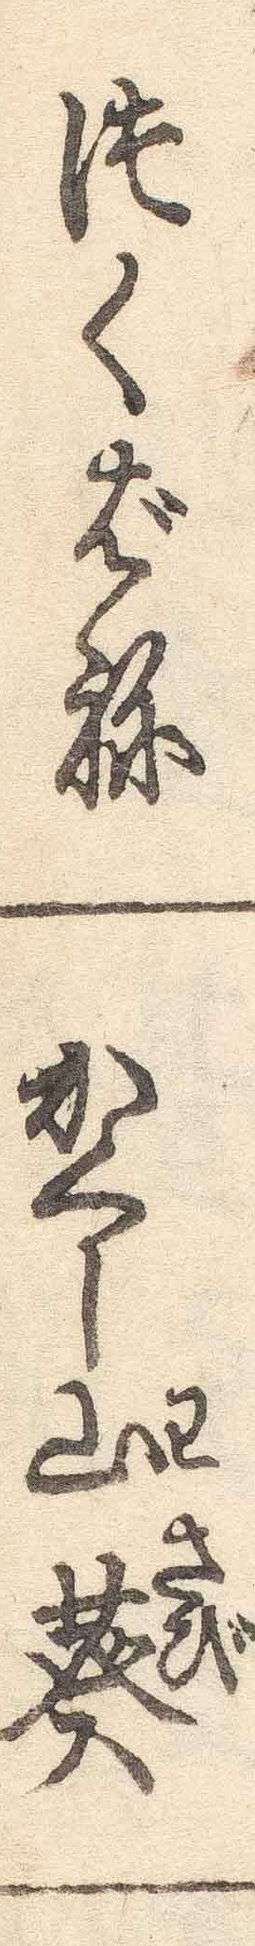つくばねからし山葵
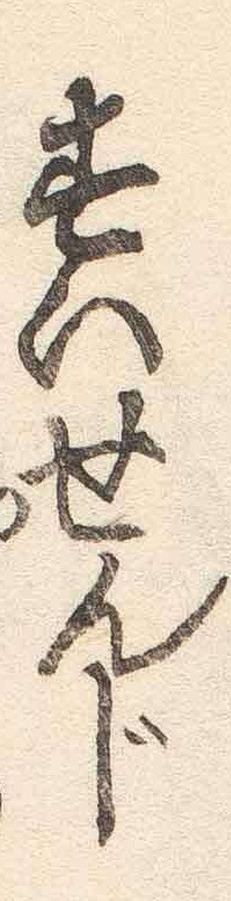すいせんじ
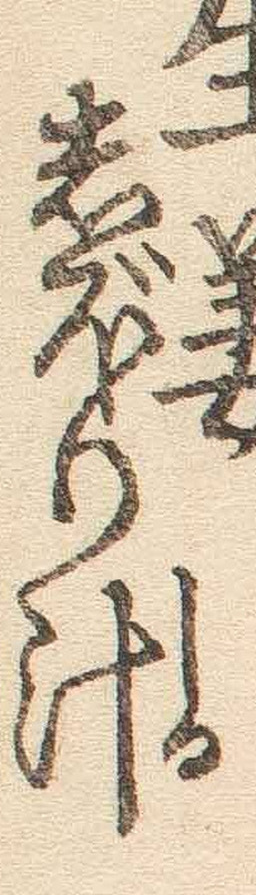しぼり汁

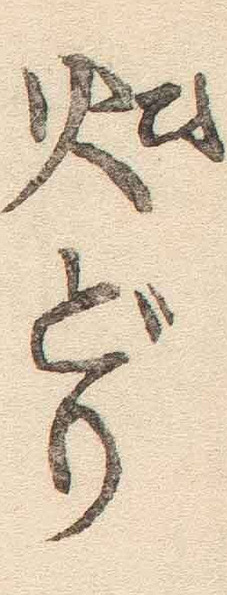火どり
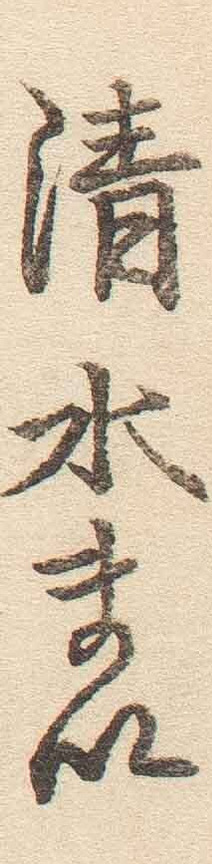清水まい
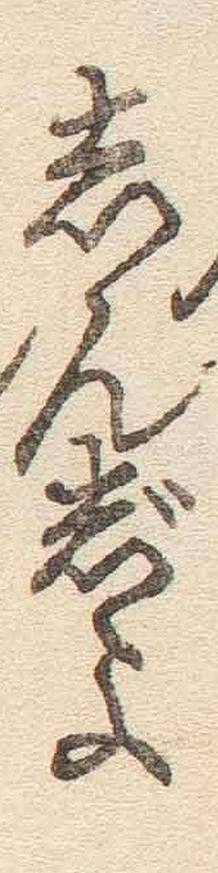しんじよ
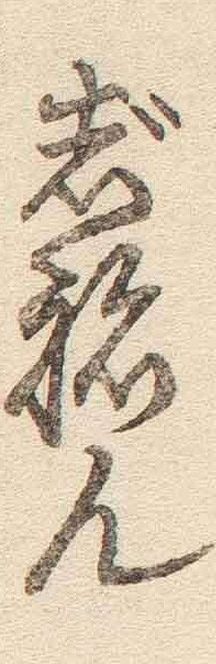じねん
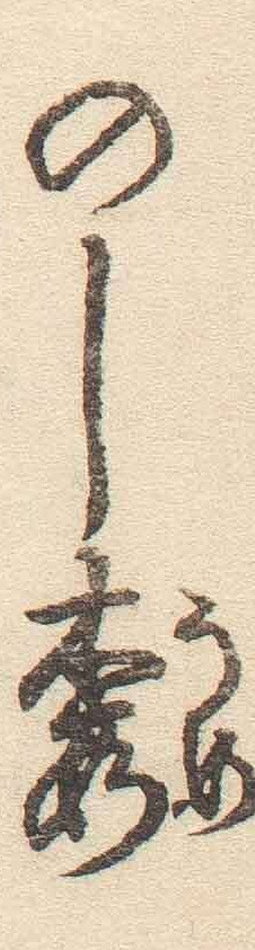のし梅
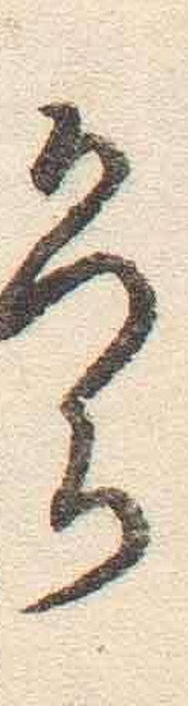かつら
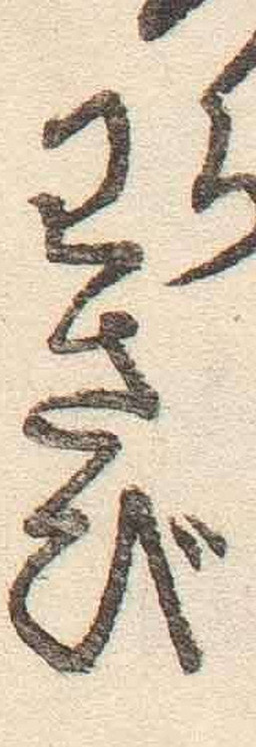わさび
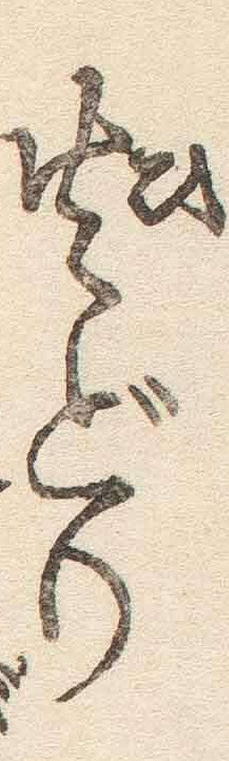火どり
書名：料理通
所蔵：東京学芸大学附属図書館 国文学研究資料館
